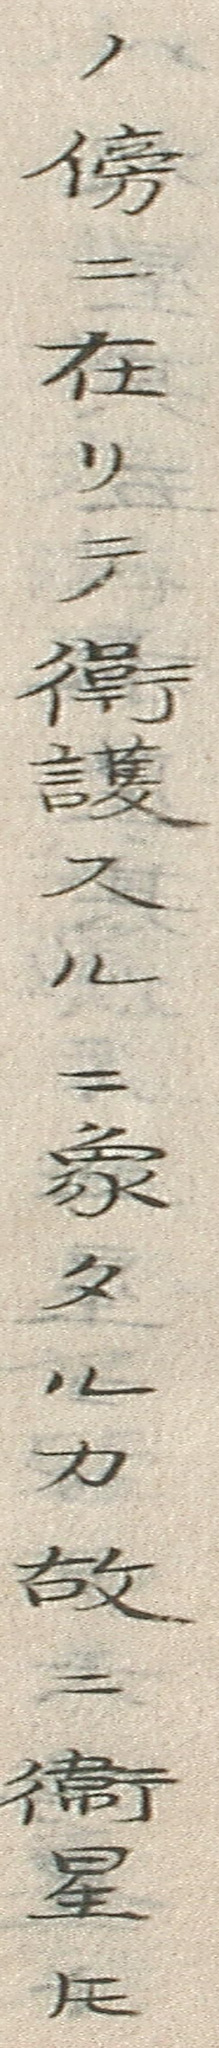ノ傍ニ在リテ衛護スルニ象タルカ故ニ衛星トモ
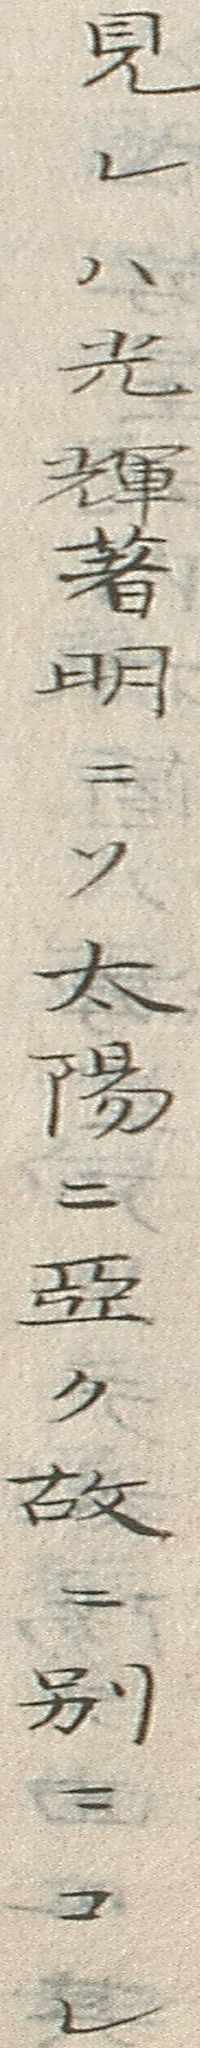見レハ光輝著明ニソ太陽ニ亞ク故ニ別ニコレ
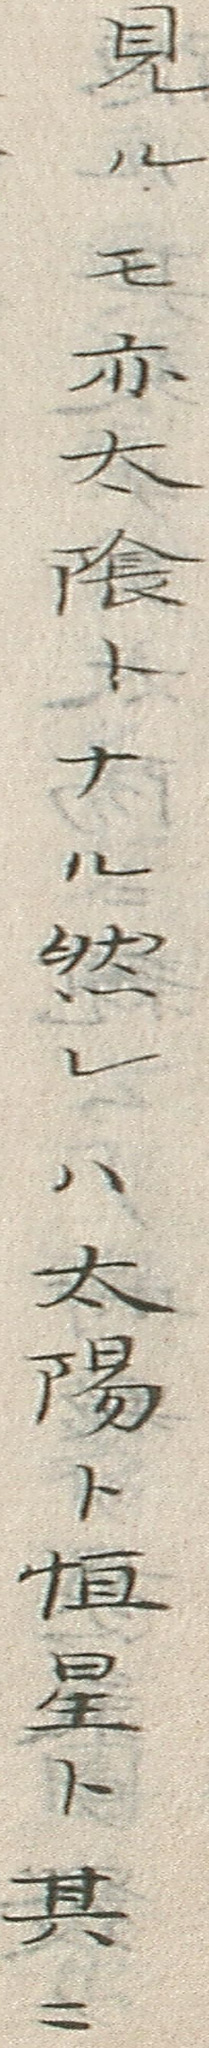見ルモ亦太陰トナル然レハ太陽ト恒星ト其ニ
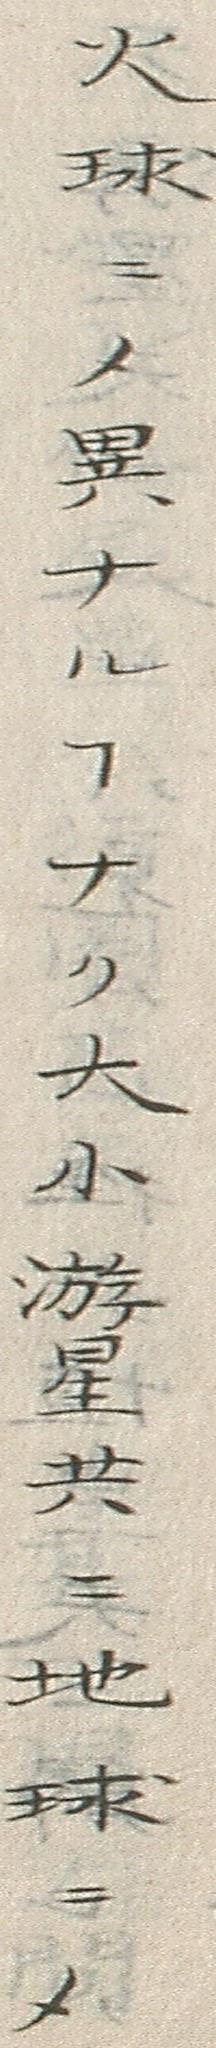火球ニシテ異ナルコトナリ大小游星共ニ地球ニシテ
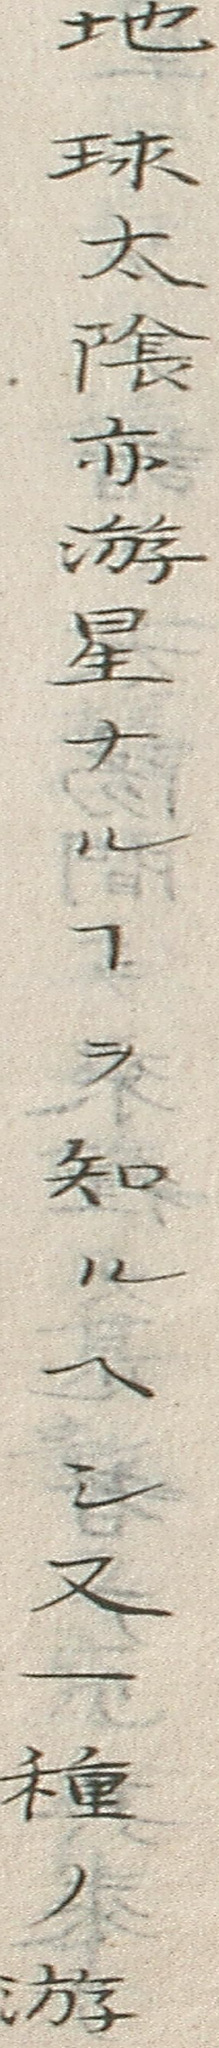地球太陰亦游星ナルコトヲ知ルヘシ又一種ノ游

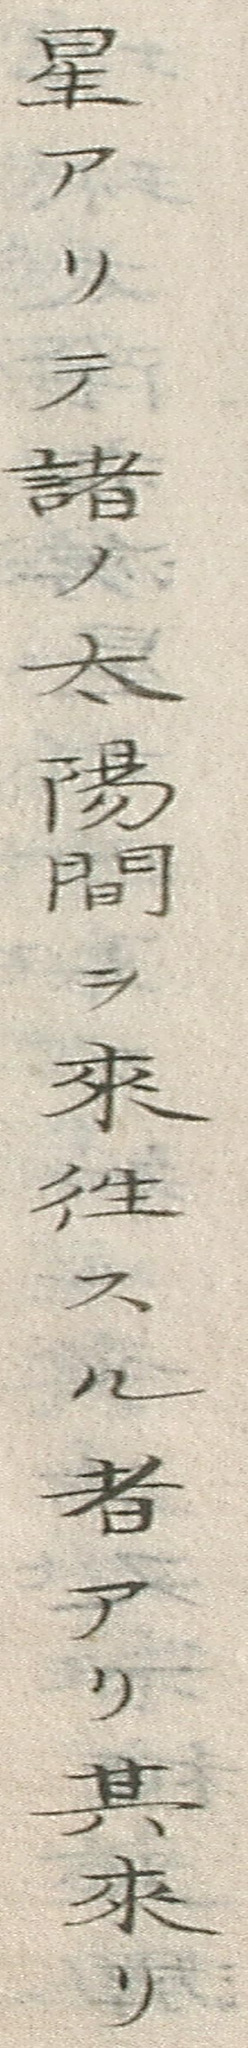星アリテ諸ノ太陽間ヲ来往スル者アリ其来リ
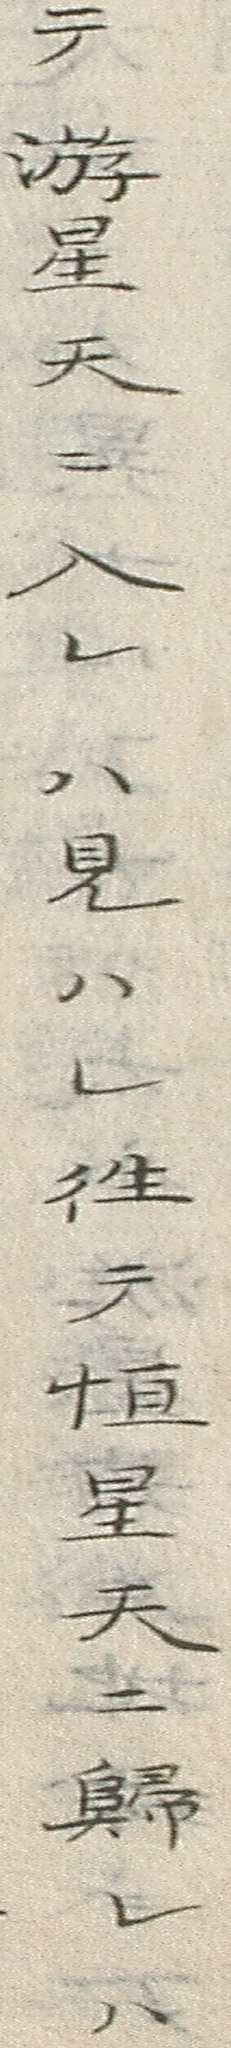テ游星天ニ入レハ見ハレ往テ恒星天ニ帰レハ
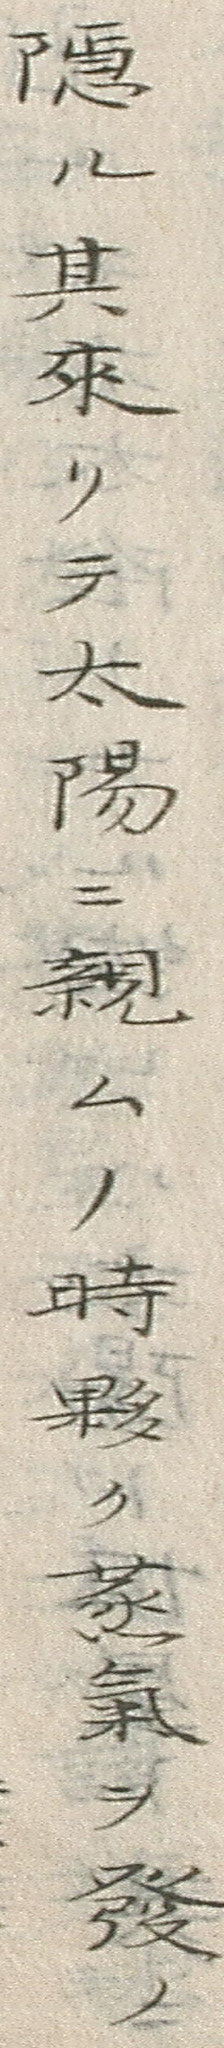隠ル其来リテ太陽ニ親ムノ時夥ク蒸気ヲ発ノ
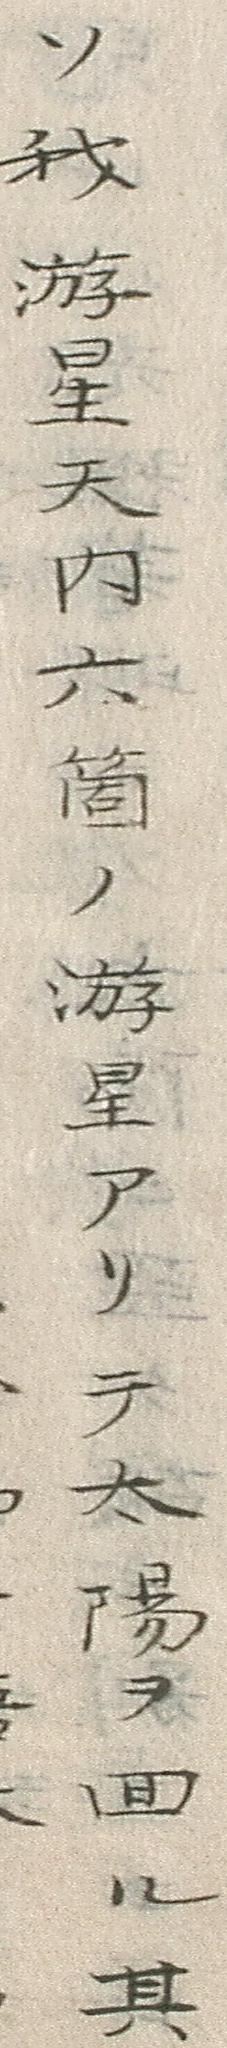ソ我游星天内六箇ノ游星アリテ太陽ヲ回ル其
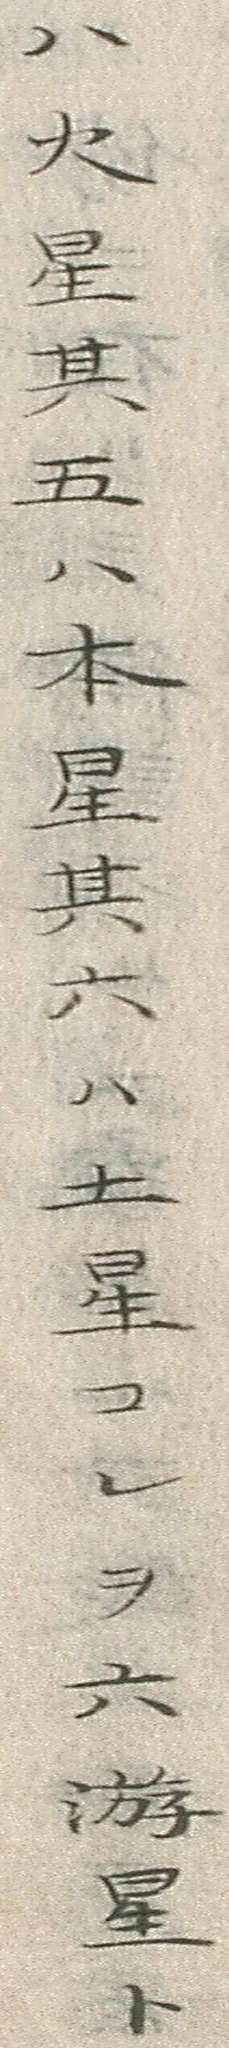ハ火星其五ハ本星其六ハ土星コレヲ六游星ト
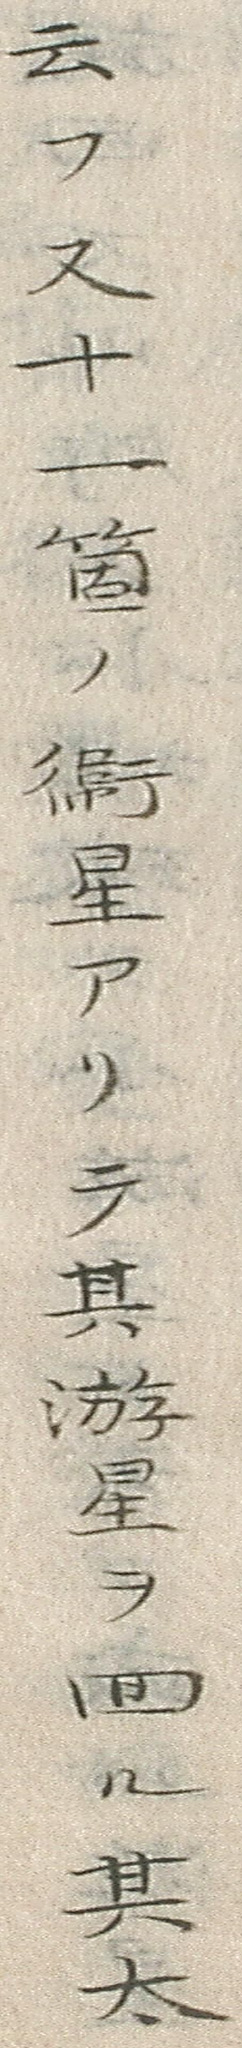云フ又十一箇ノ衛星アリテ其游星ヲ回ル其太
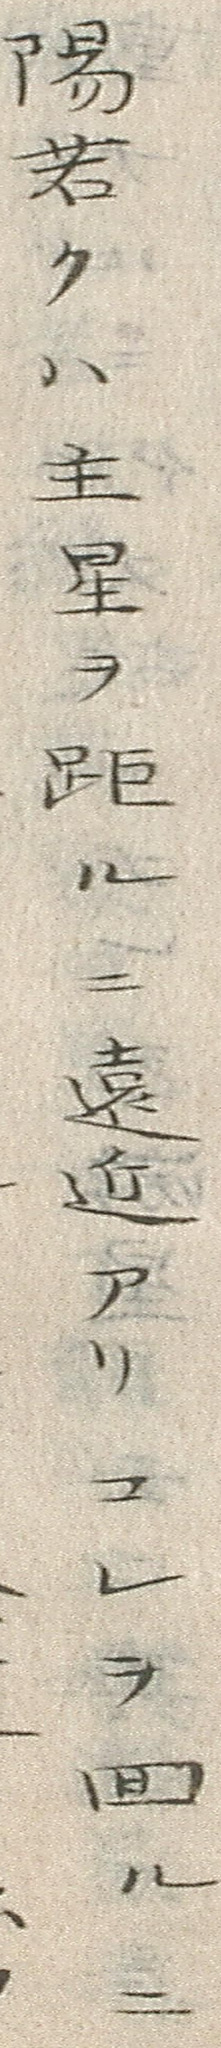陽若クハ主星ヲ距ルニ遠近アリコレヲ回ルニ
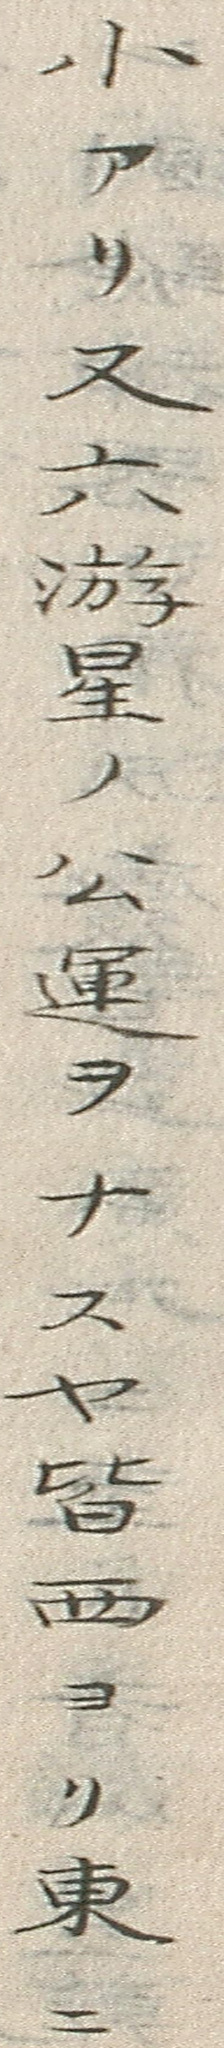小アリ又六游星ノ公運ヲナスヤ皆西ヨリ東ニ
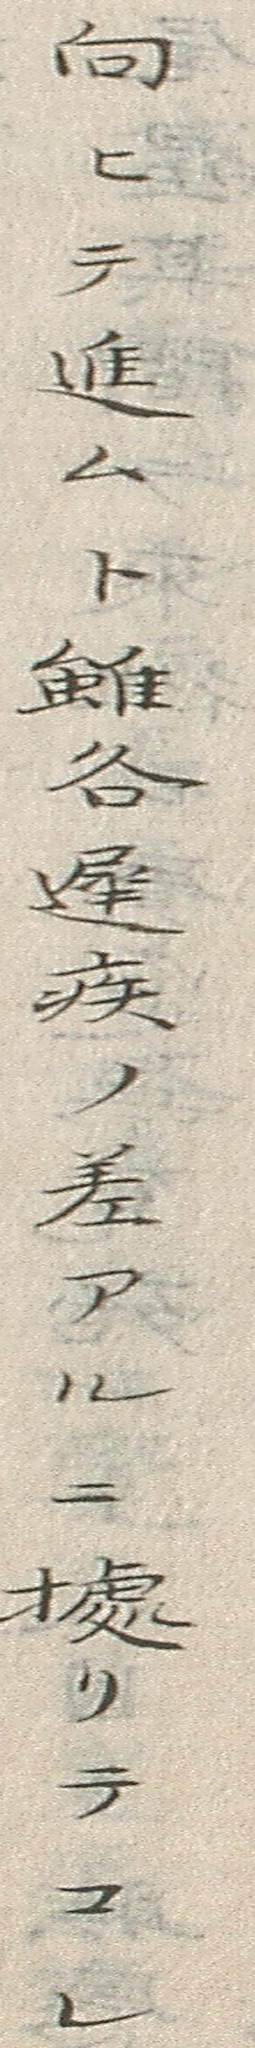向ヒテ進ムト雖各遅疾ノ差アルニ拠リテコレ
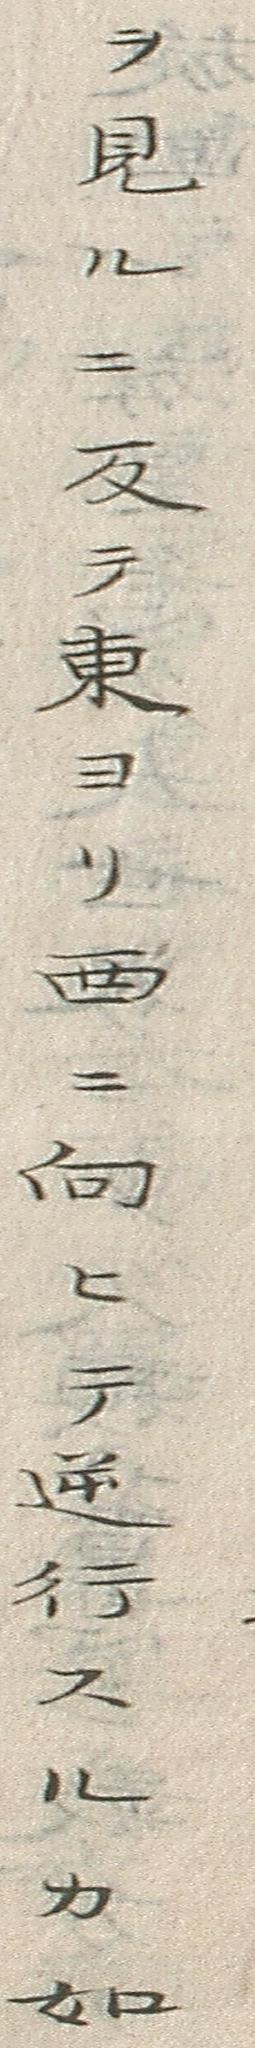ヲ見ルニ反テ東ヨリ西ニ向ヒテ逆行スルカ如
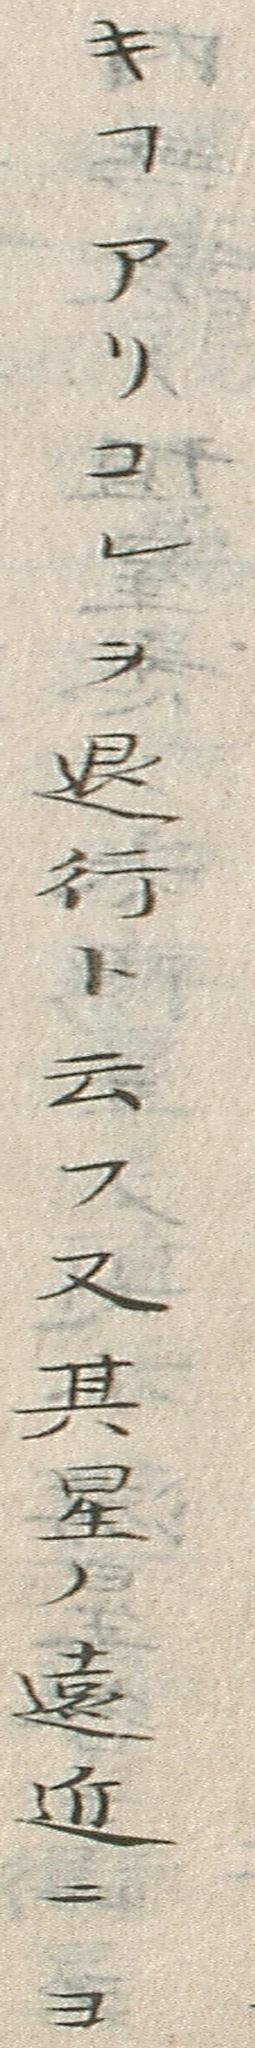キコトアリコレヲ退行ト云フ又其星ノ遠近ニヨ
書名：天學略名目羽翼　全
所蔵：東京大学地震研究所図書室 Earthquake Research Institute Library, The University of Tokyo, JAPAN
